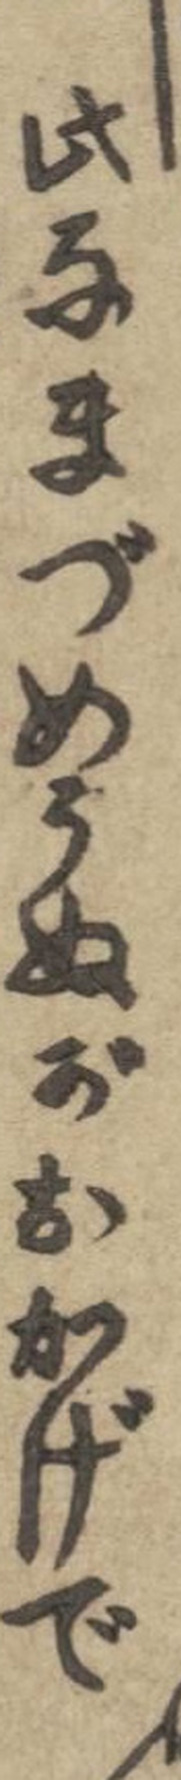〽此なまづめうぬがおかげで
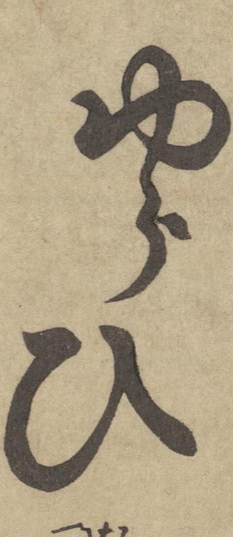ゆらひ
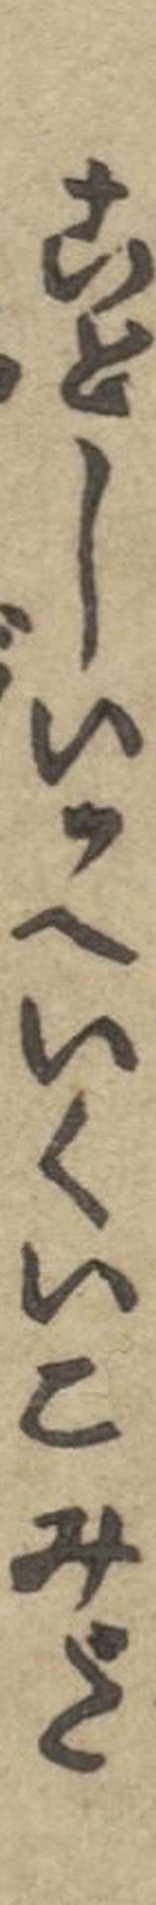ことしいつへいくいこみだ
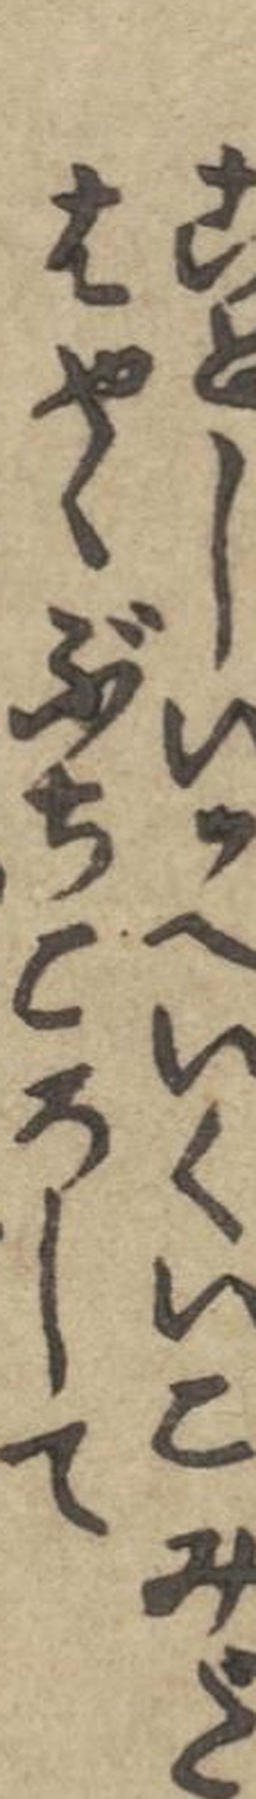はやくぶちころして
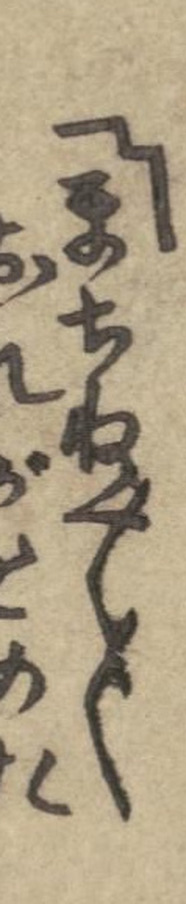〽まちねへ〳〵〳〵
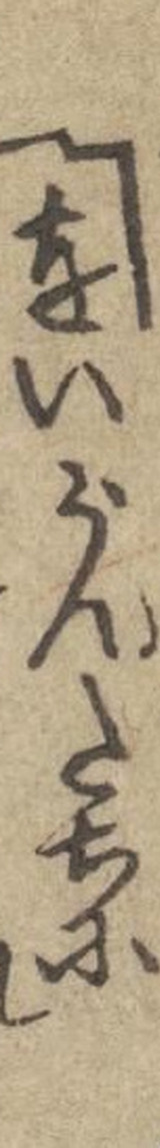〽をいらんたちに
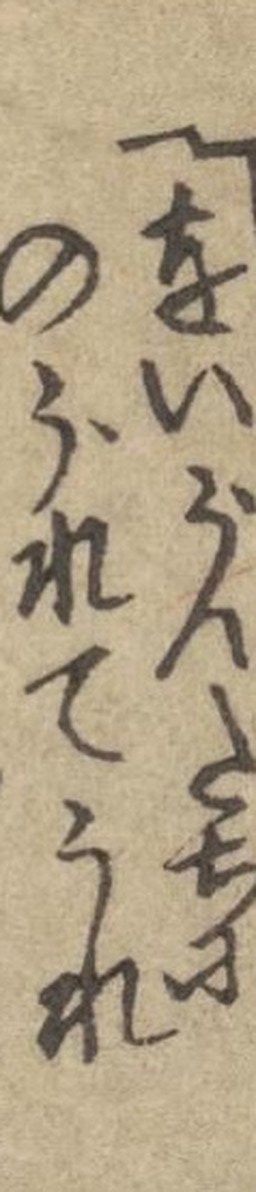のられてうれ
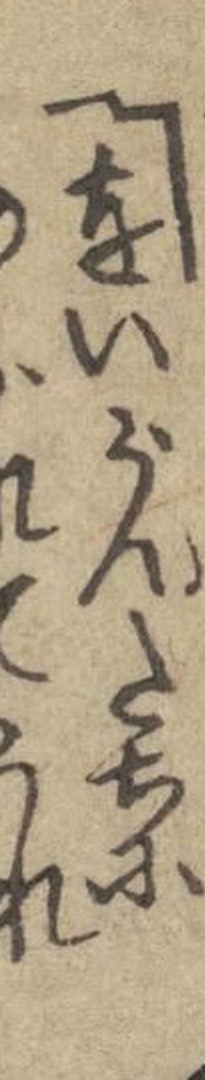〽をいらんたちに
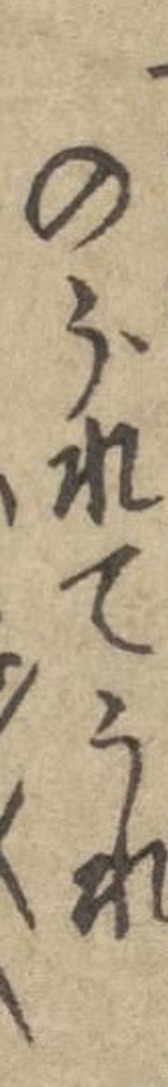のられてうれ
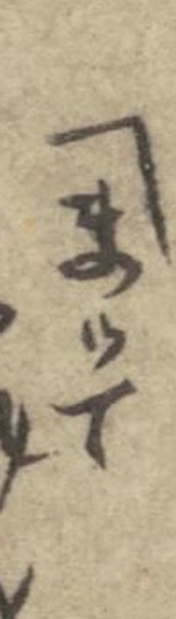〽まって
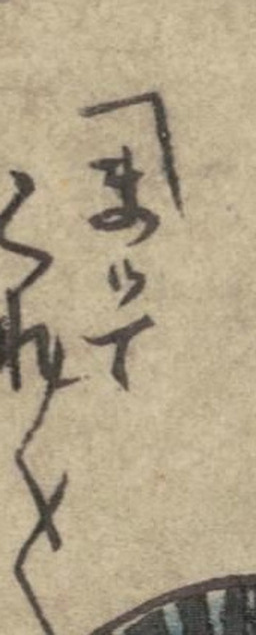〽まって
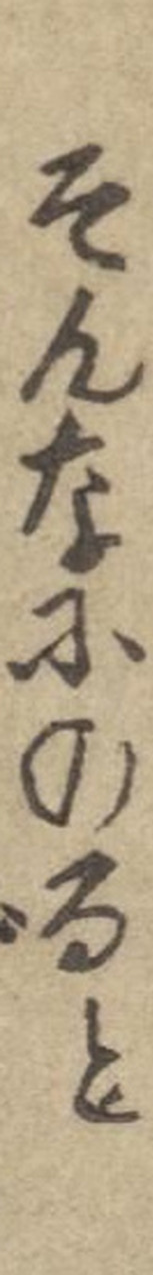そんなにのると
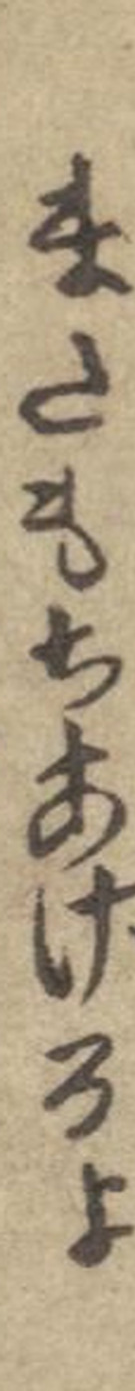またもちあげるよ
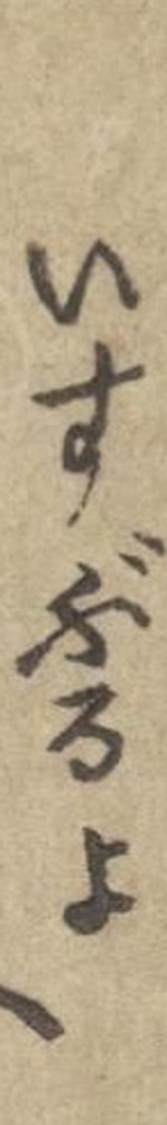いすぶるよ
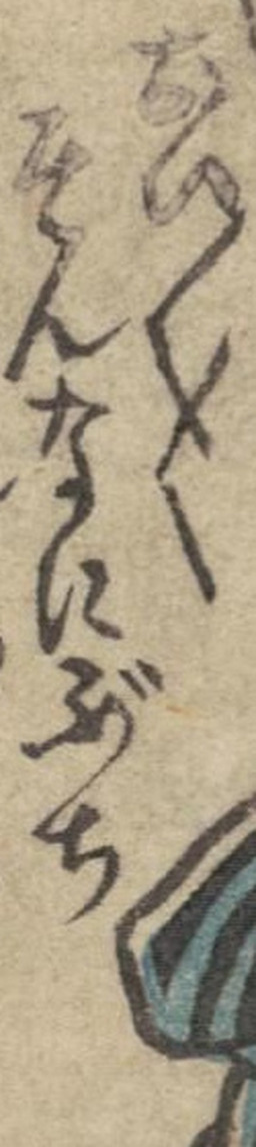そんなにぶち
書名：しんよし原大なまづゆらひ
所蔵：東京大学地震研究所図書室 Earthquake Research Institute Library, The University of Tokyo, JAPAN
